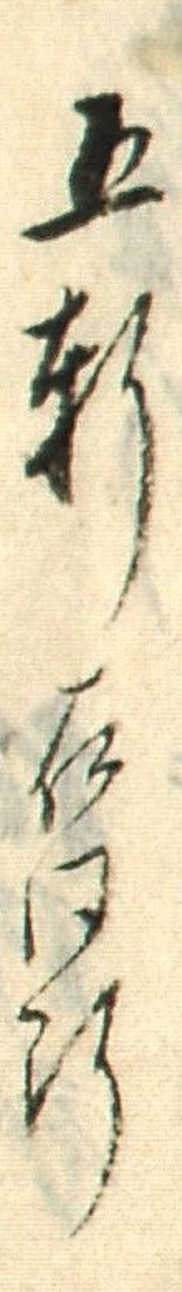五軒右同断

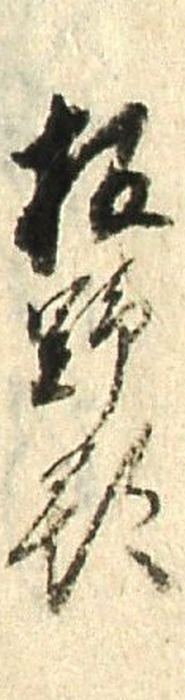板野郡
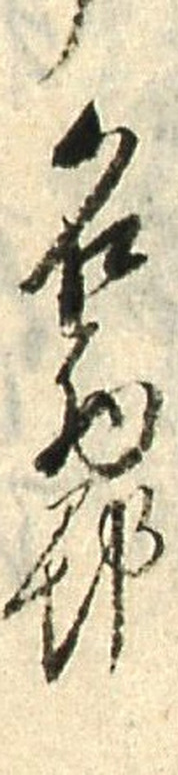名西郡
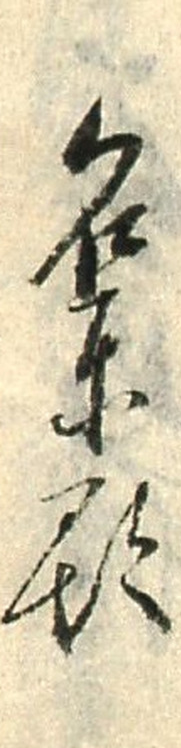名東郡
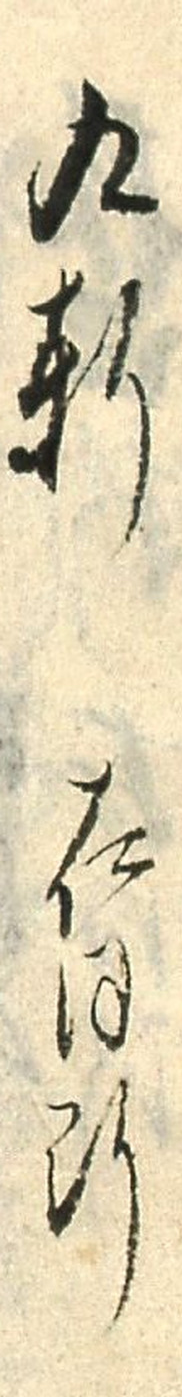九軒右同断
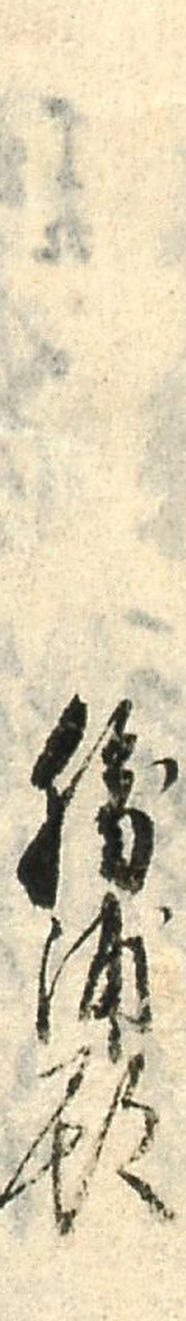勝浦郡
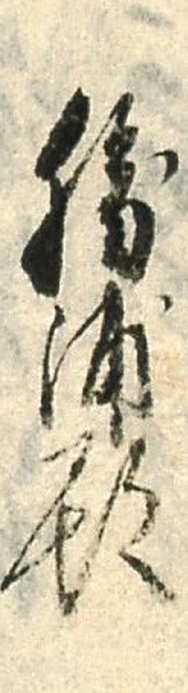勝浦郡
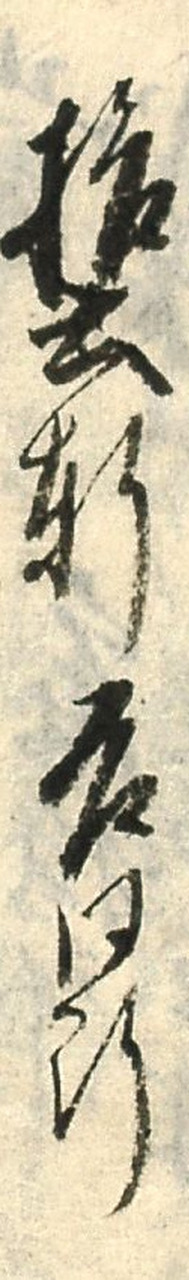拾六軒右同断
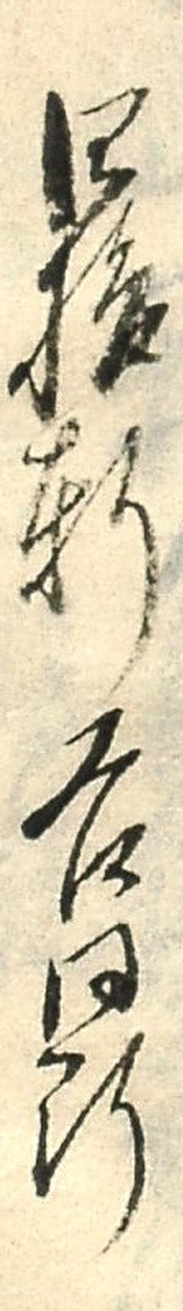四拾軒右同断
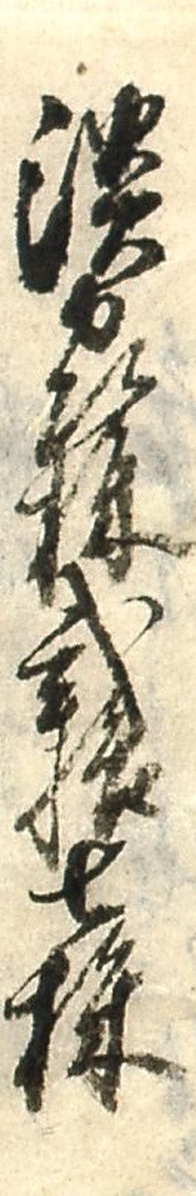淡州株弐拾七株
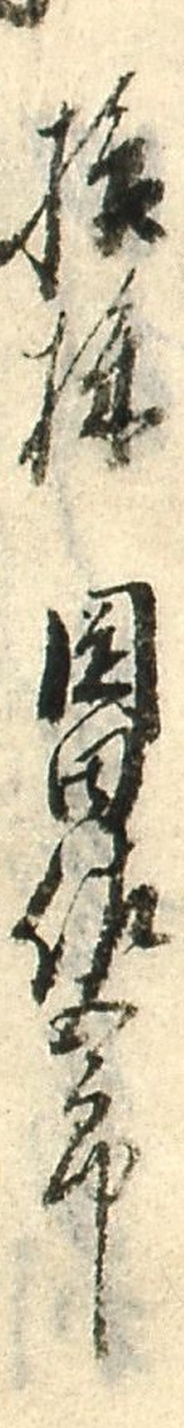拾株岡田佐五郎
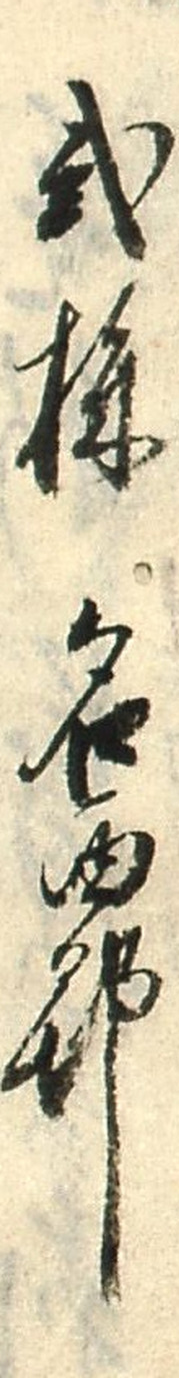弐株名西郡
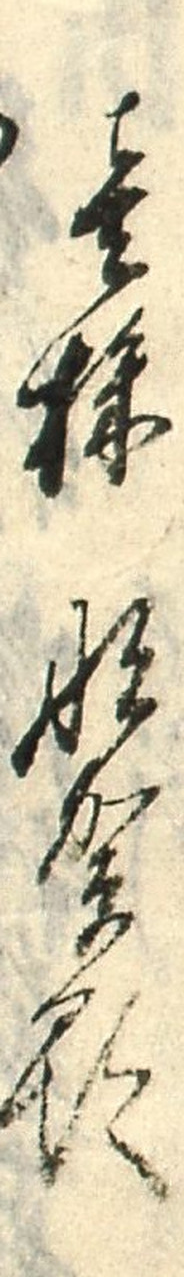壱株那賀郡
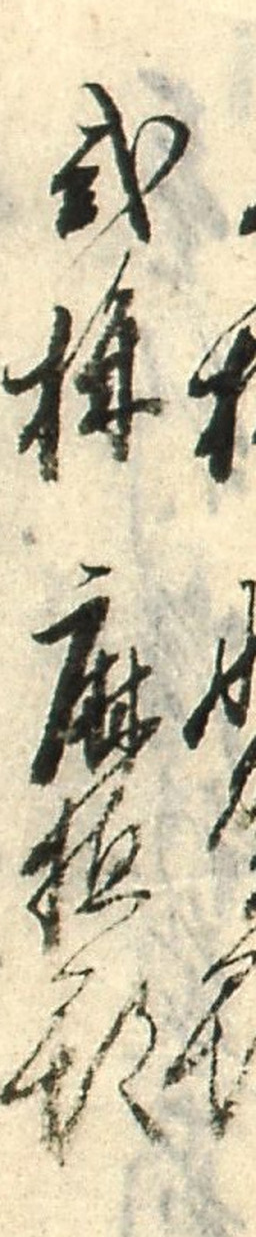弐株麻植郡
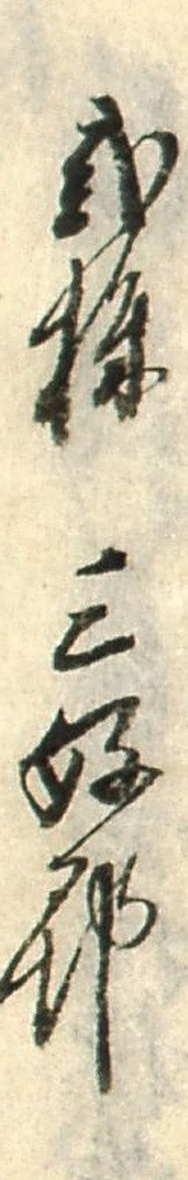弐株三好郡
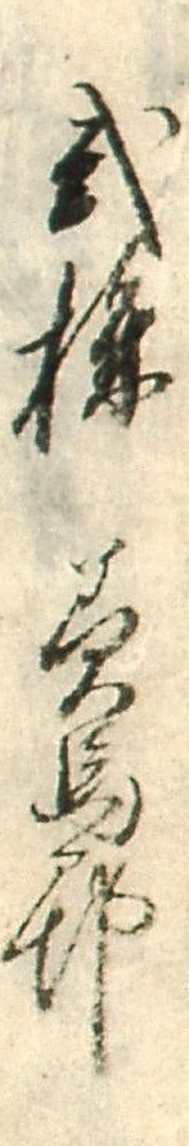弐株美馬郡
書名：南北拾郡造酒屋数並株数調子帳
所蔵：鳴門教育大学 Naruto University of Education
